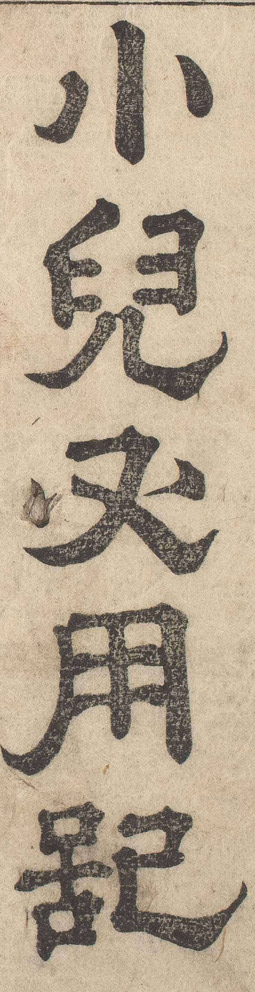小兒必用記
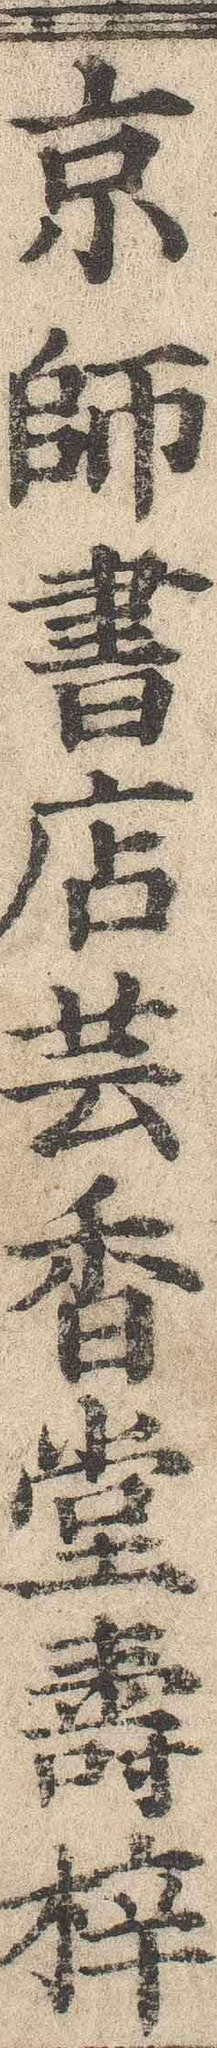京師書店芸香堂壽梓

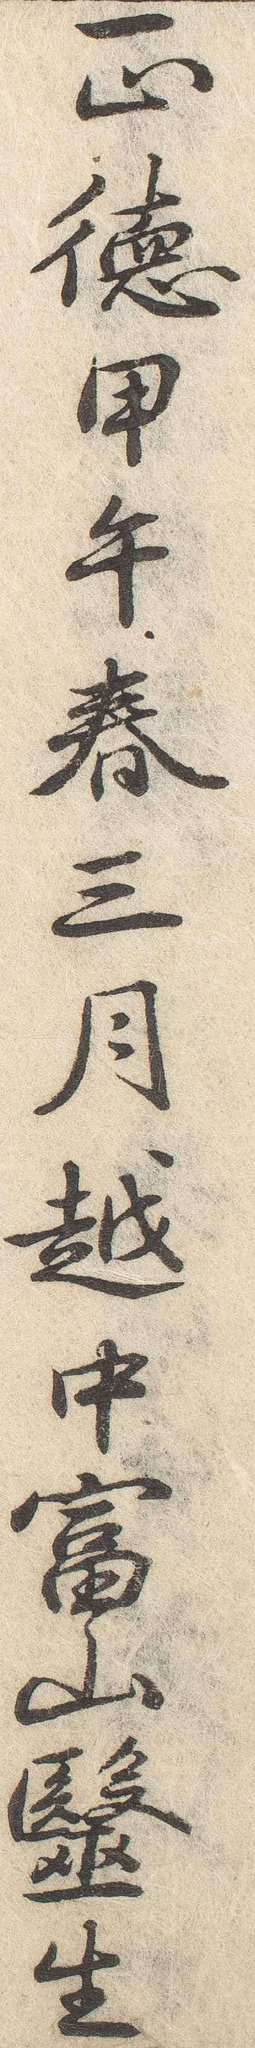正德甲午春三月越中富山毉生
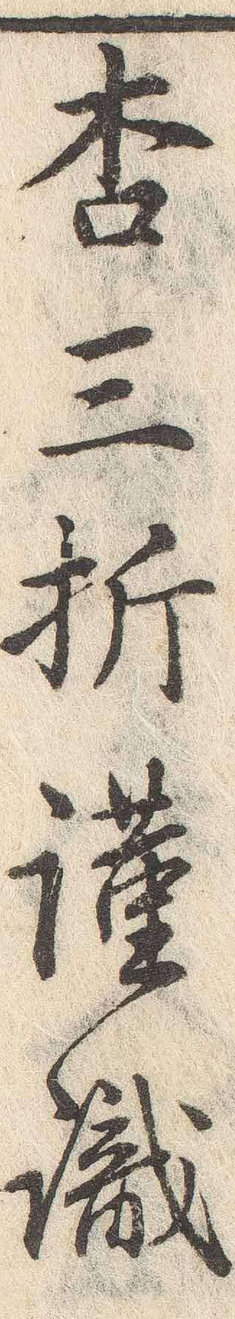杏三折謹識
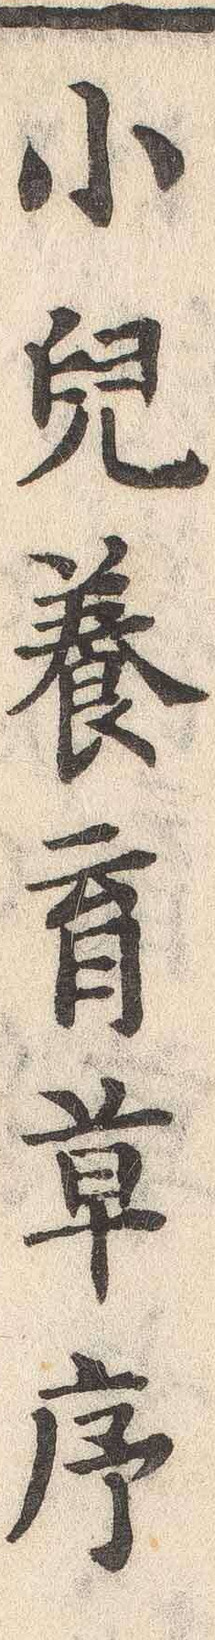小兒養育草序
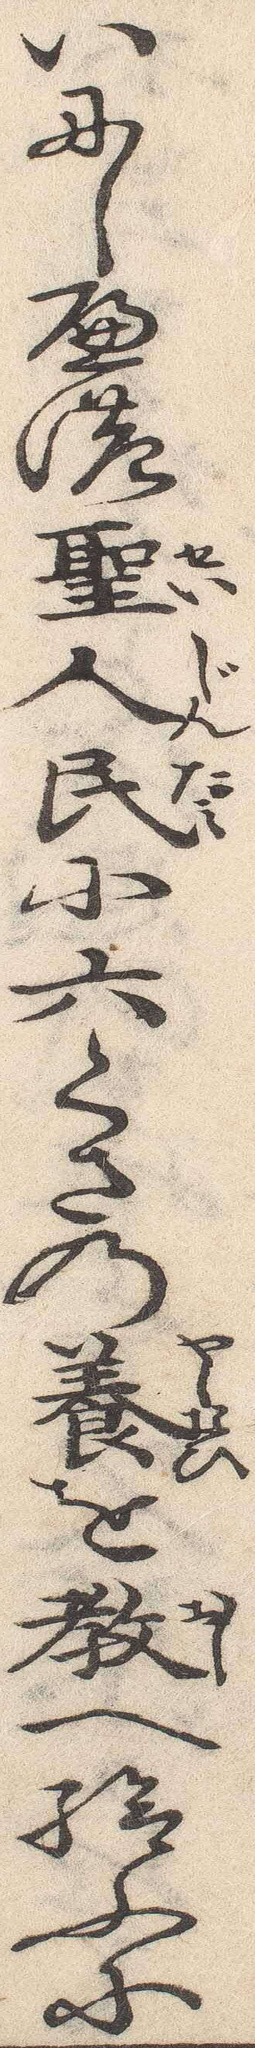いにしへの聖人民に六くさの養を教へ給ふに
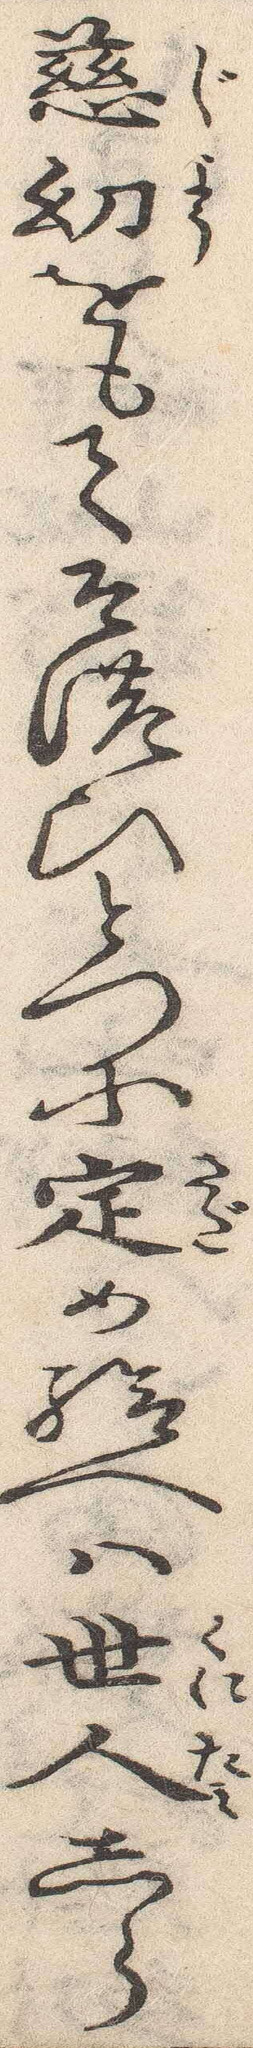慈幼をもてそのひとつに定め給へは世人しら
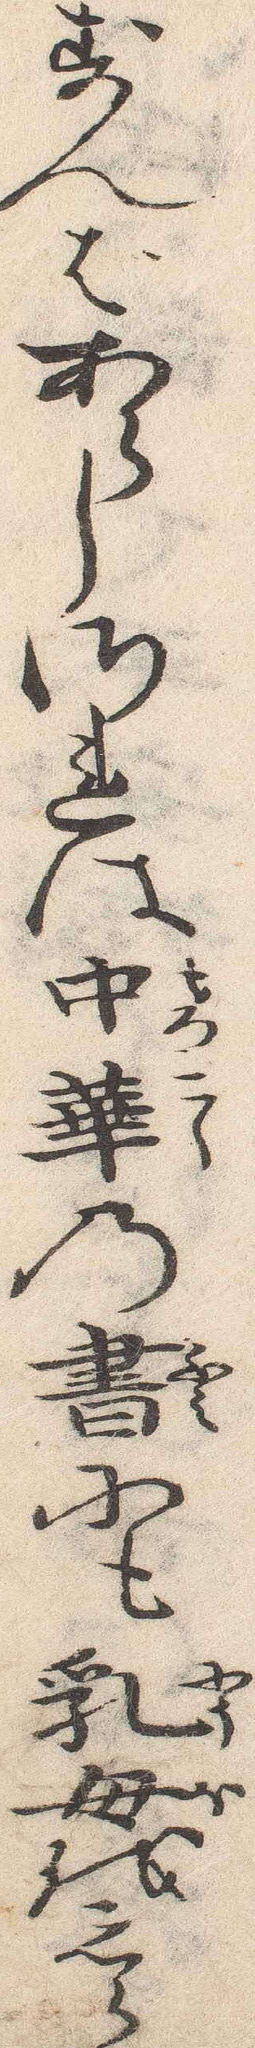すんばあらしされは中華の書にも乳母をえら
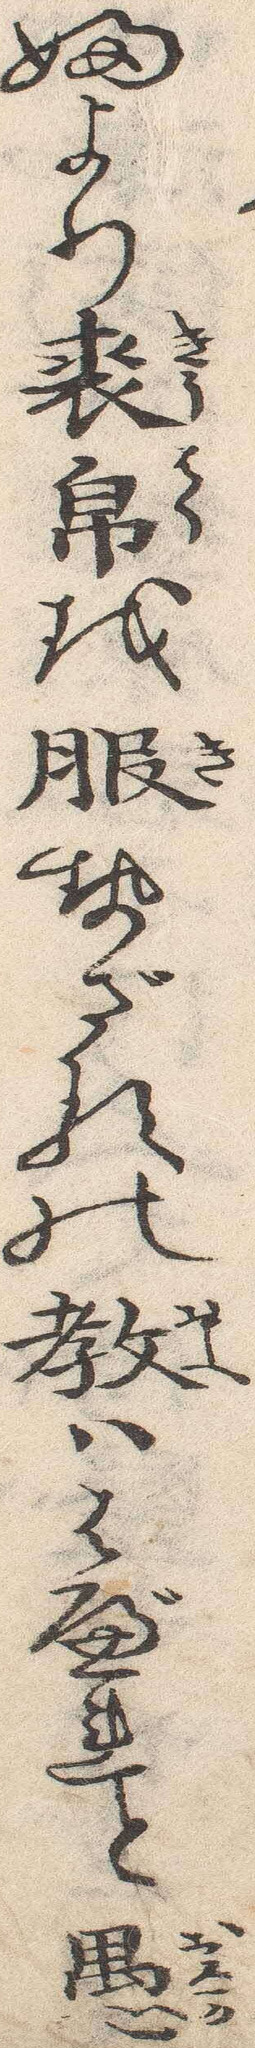ふより裘帛を服せざるの教ははべれと愚
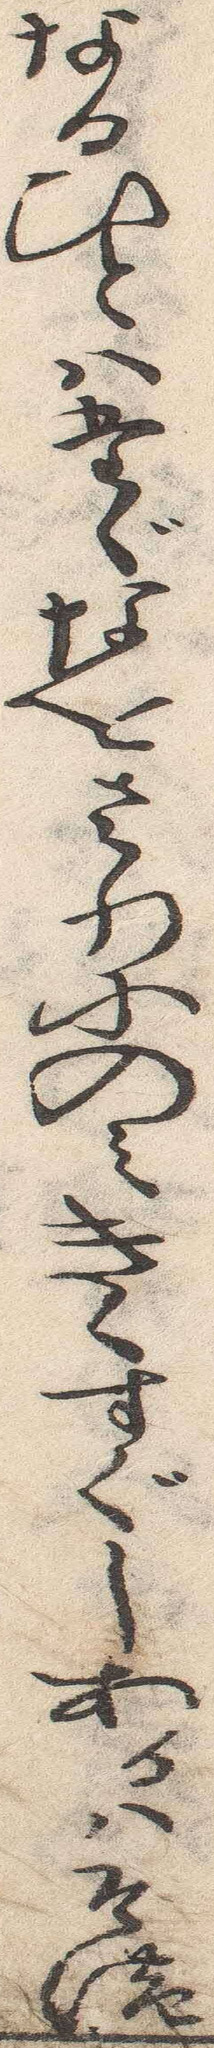なるひとはたゞなをさりにのみきゝすぐしあるはその
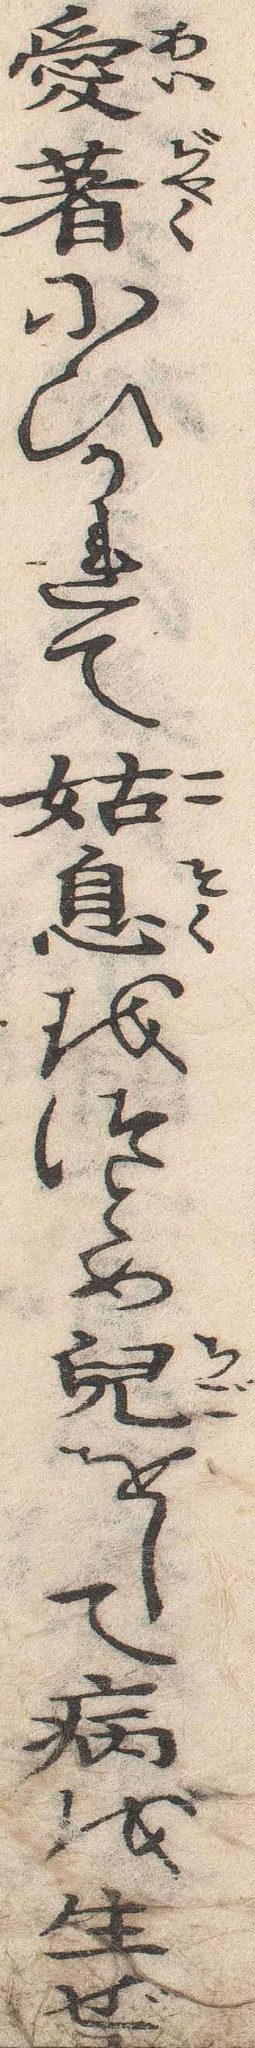愛著にひかれて姑息をつとめ兒をして病を生ぜ
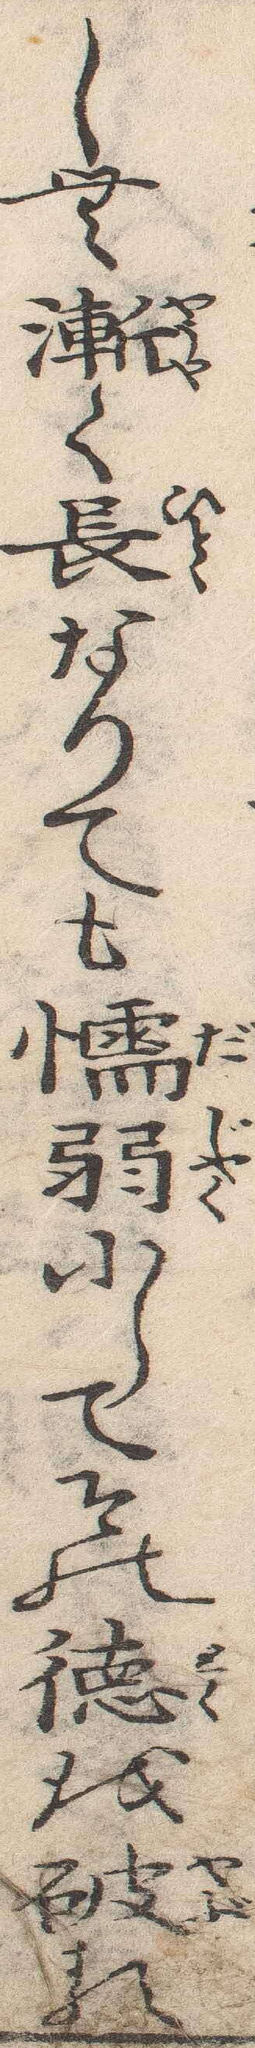しむ漸く長なりても懦弱にしてその徳を破る
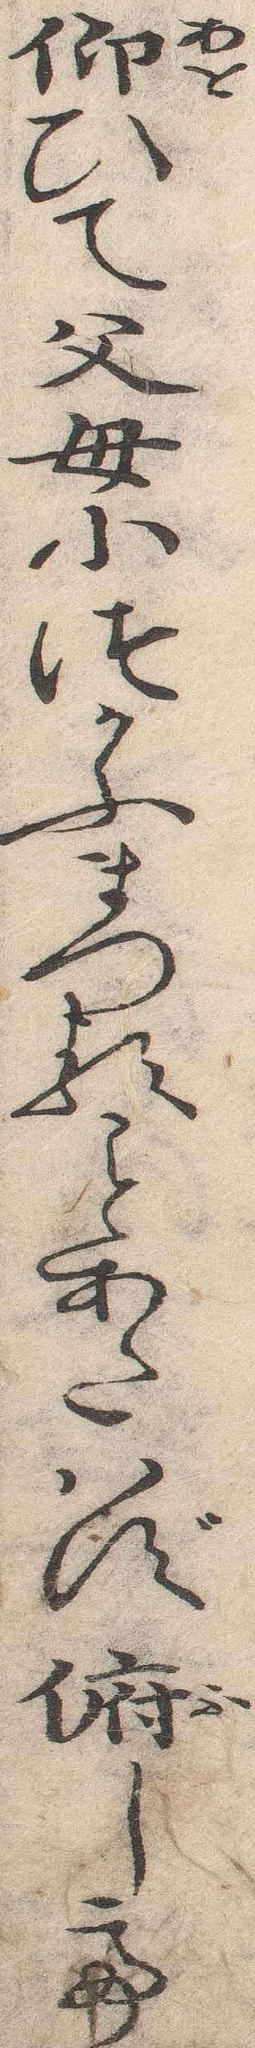仰ひて父母につかふまつることあたはず俯して

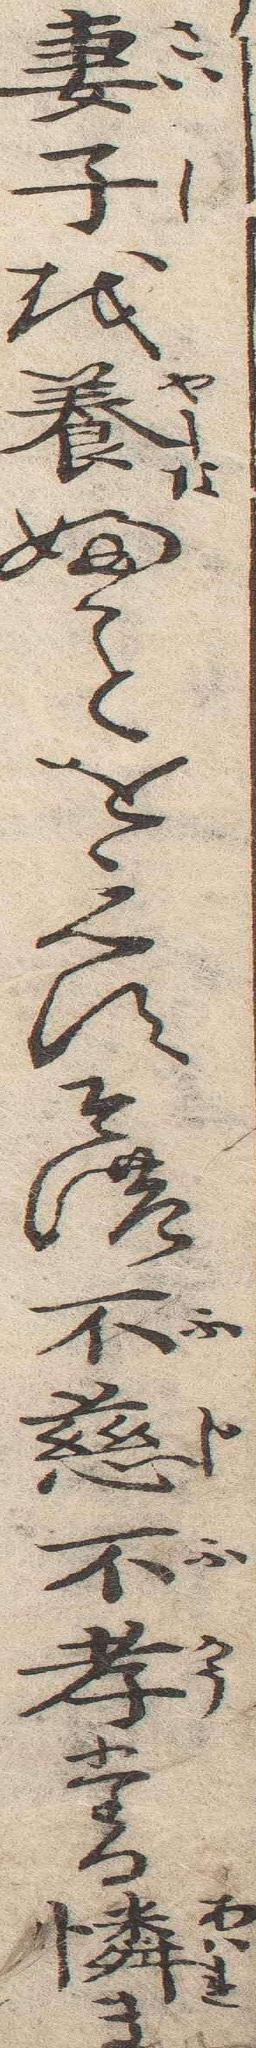妻子を養ふことをえすその不慈不孝たる憐ま
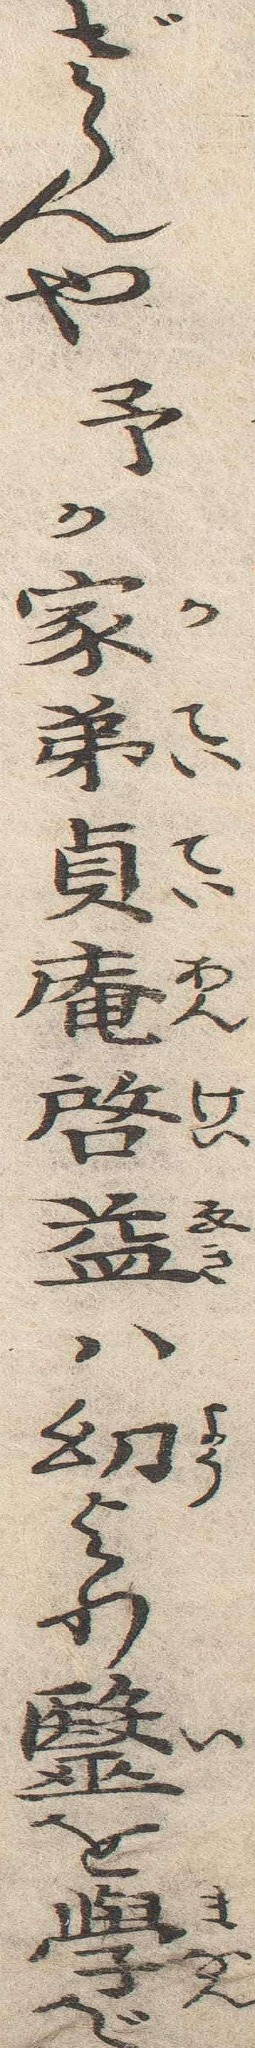ざらんや予か家弟貞庵啓益は幼より毉を學で
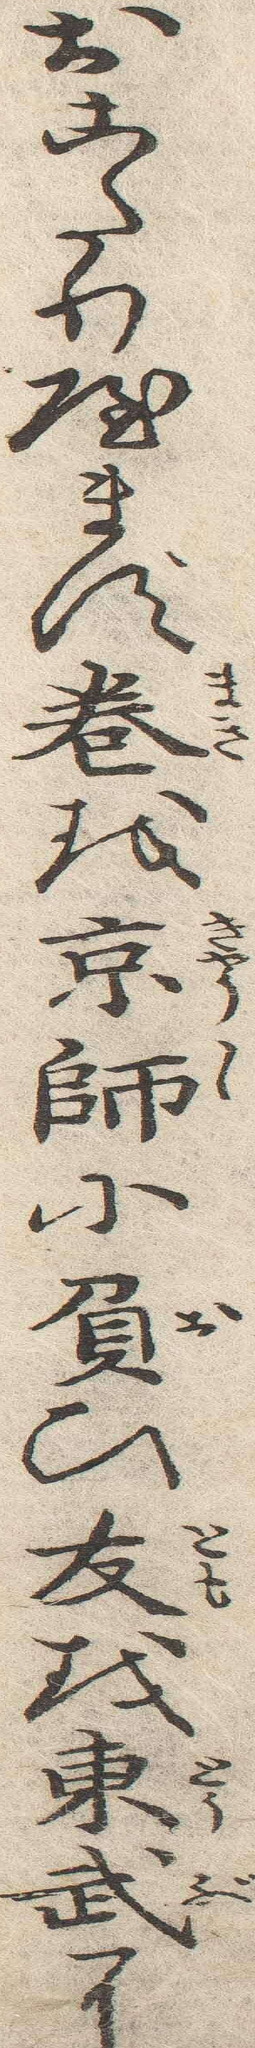おこたりやまず巻を京師に負ひ友を東武に
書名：小児必用養育草
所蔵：東京学芸大学附属図書館 国文学研究資料館
